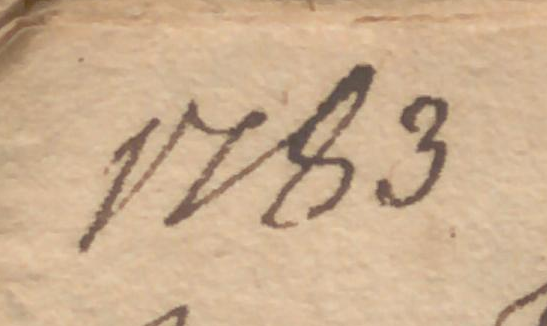1783
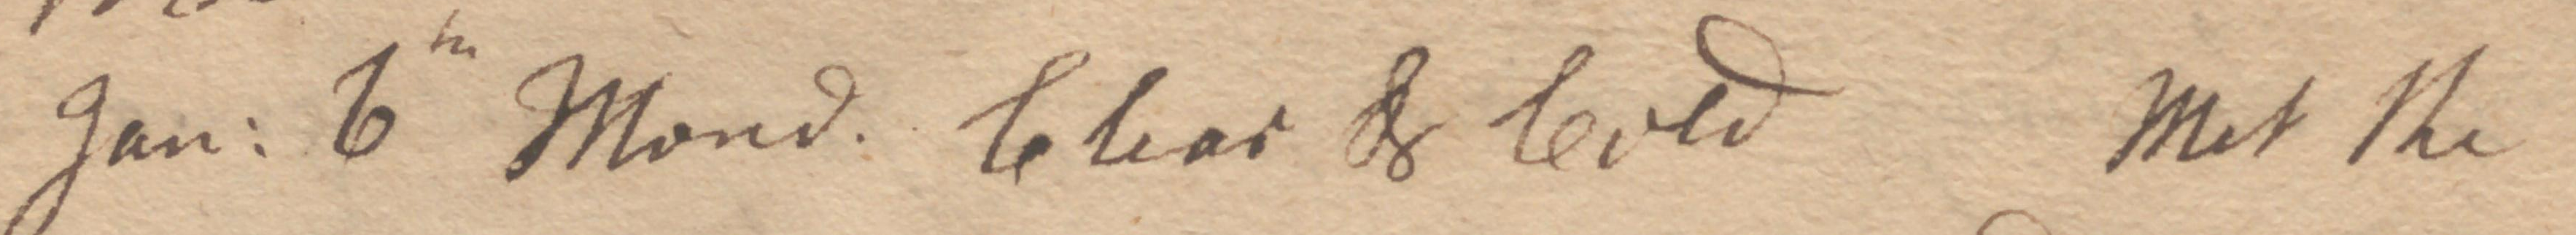Jan: 6^th Mond. Clear & Cold Met the
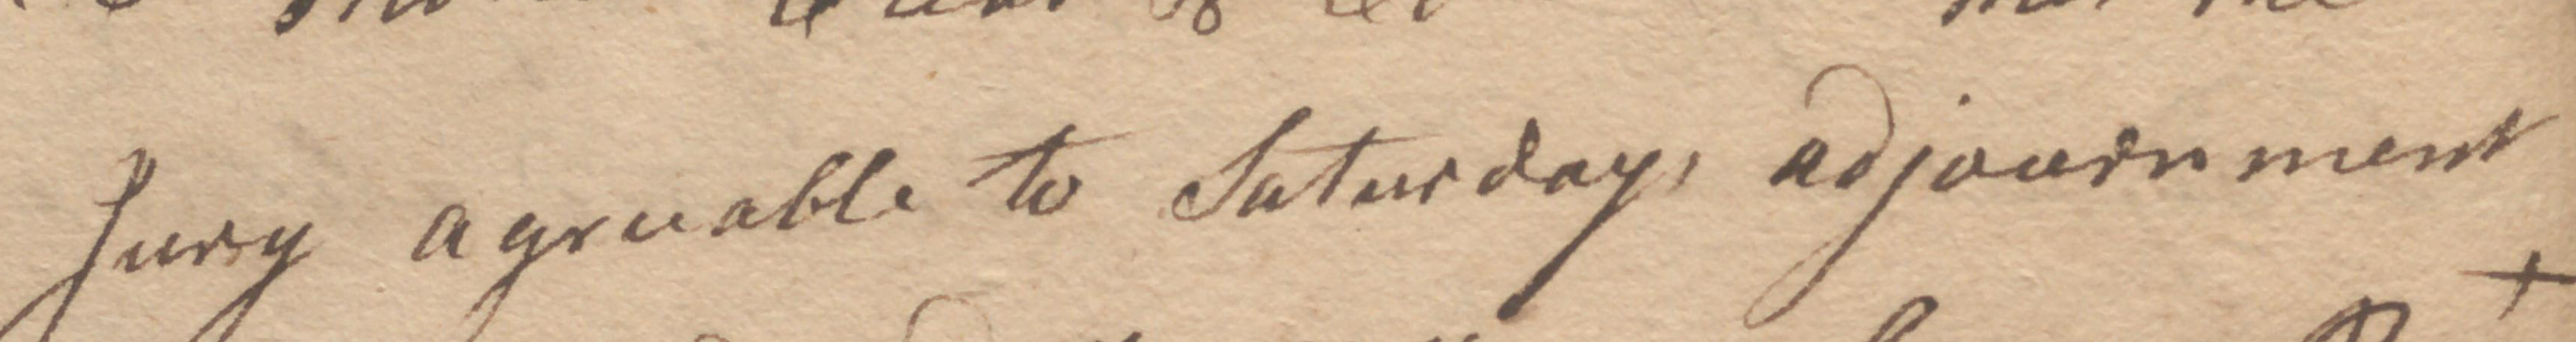Jury agreeable to Saturday, adjournment
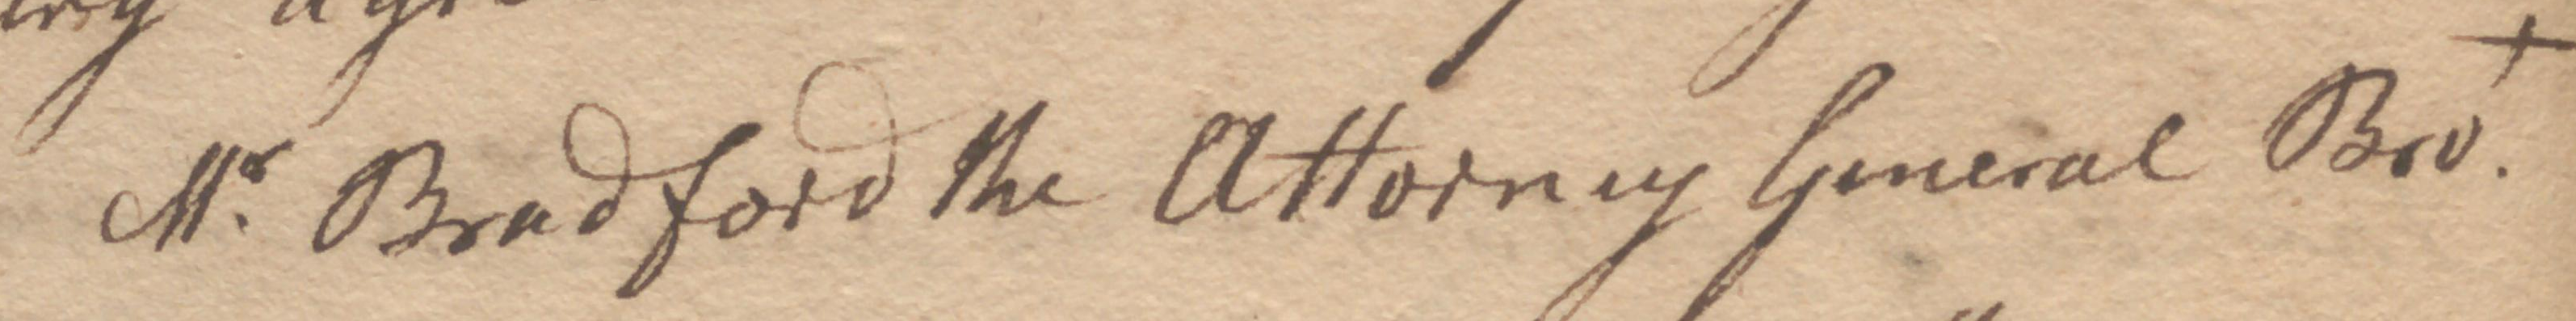M^r. Bradford the Attorney General Bro^t.
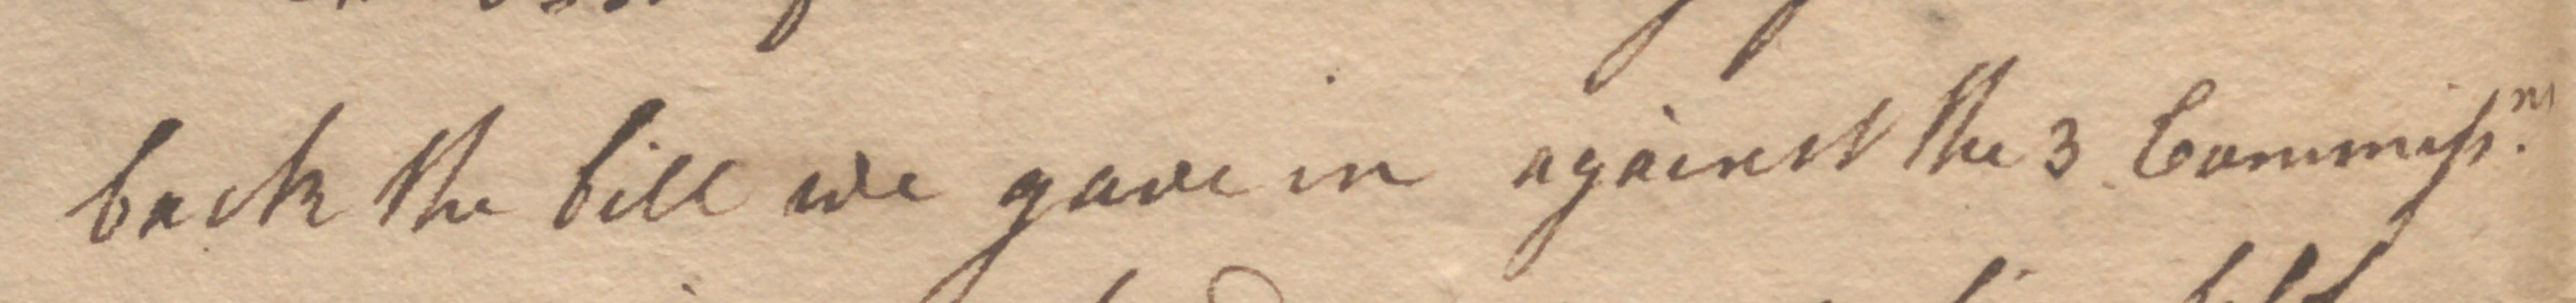back the bill we gave in against the 3 Commiss^rs.
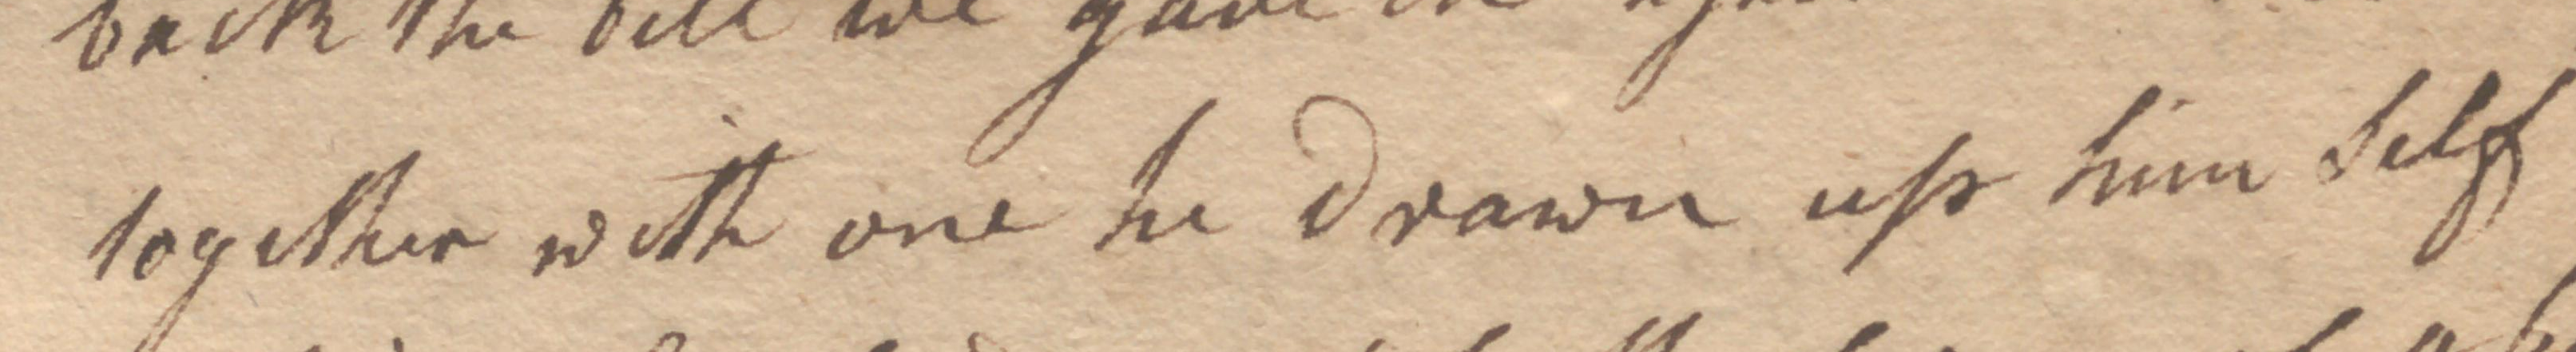together with one he drawn up him self
